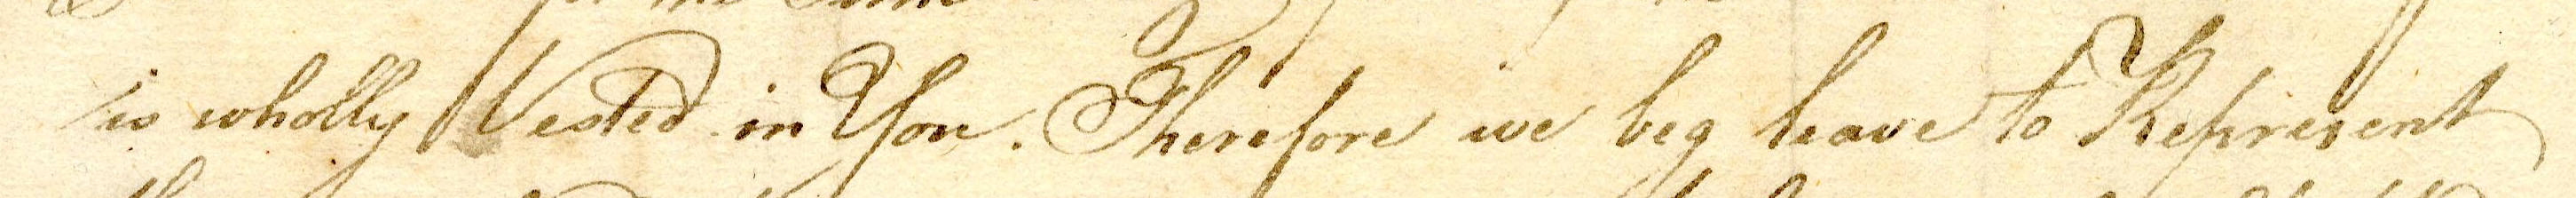is wholly Vested in You. Therefore we beg leave to Represent
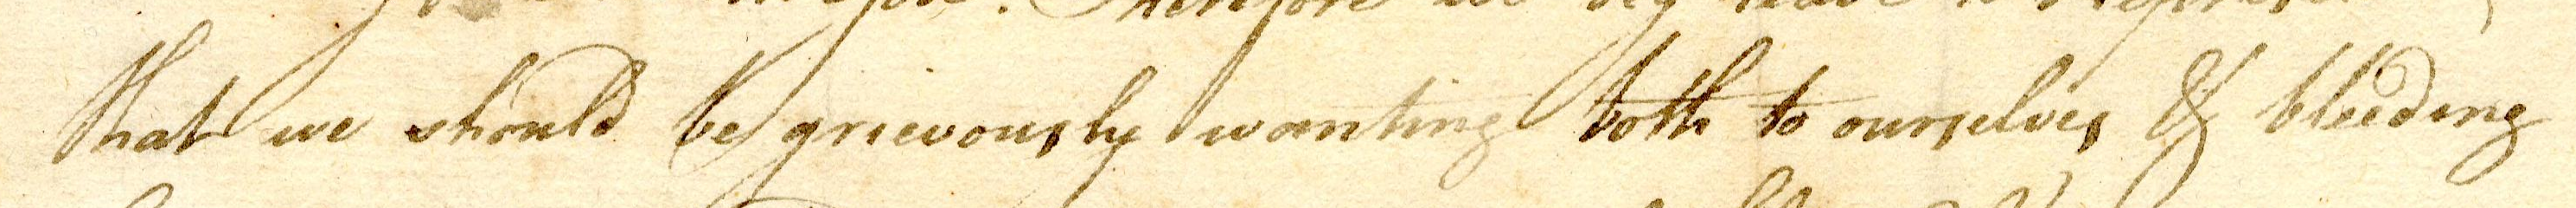that we should be grievously wanting both to ourselves & bleeding
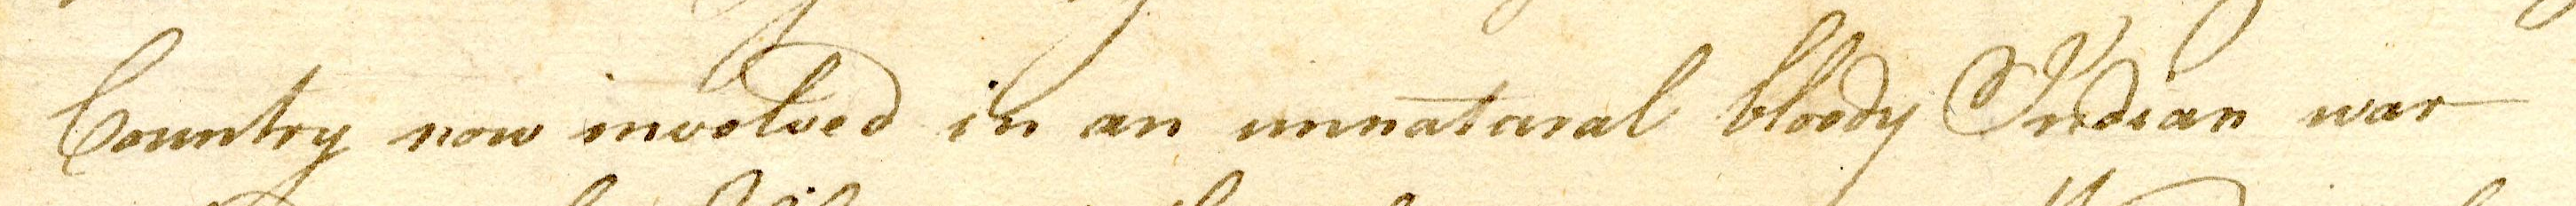Country now involved in an unnatural bloody Indian war
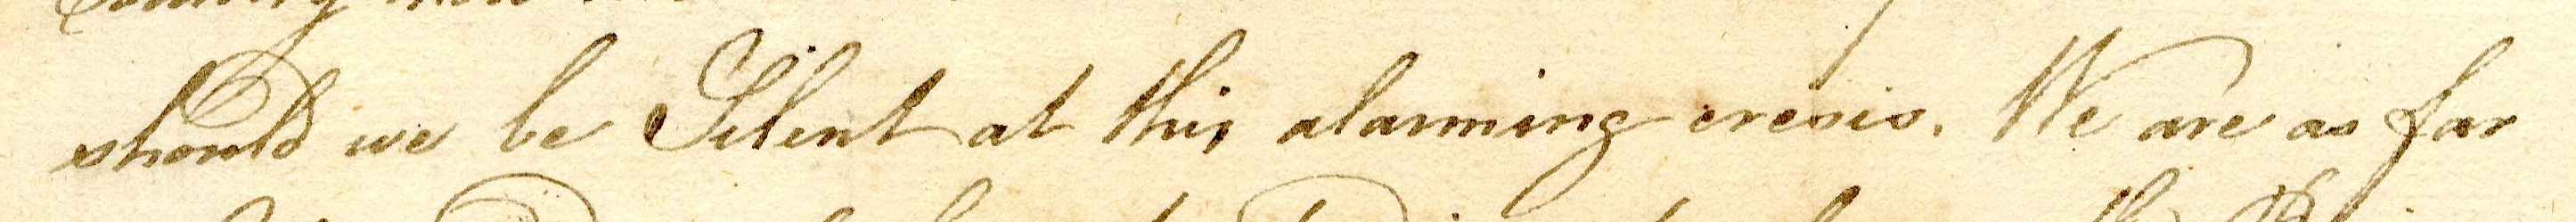should we be Silent at this alarming crisis. We are as far
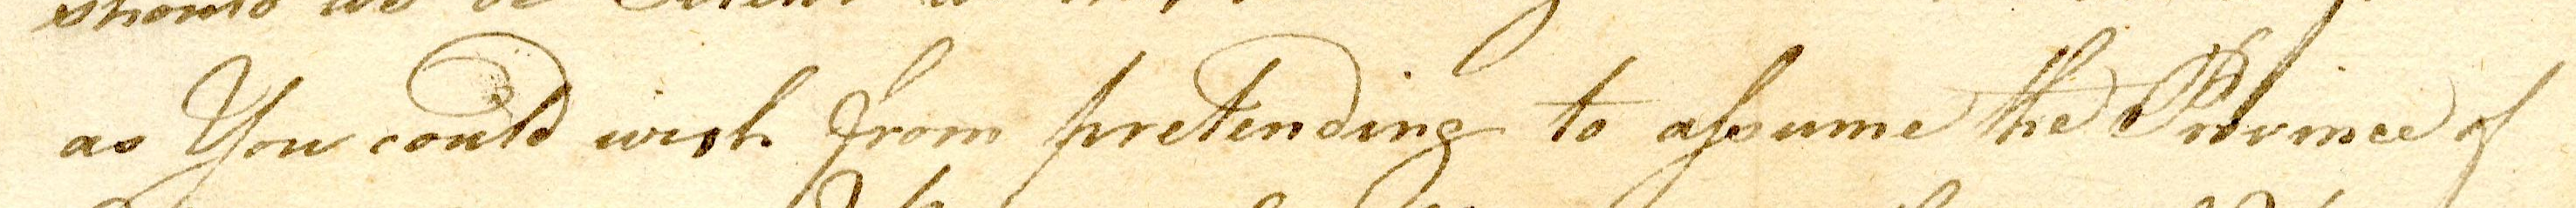as You could wish from pretending to assume the Province of
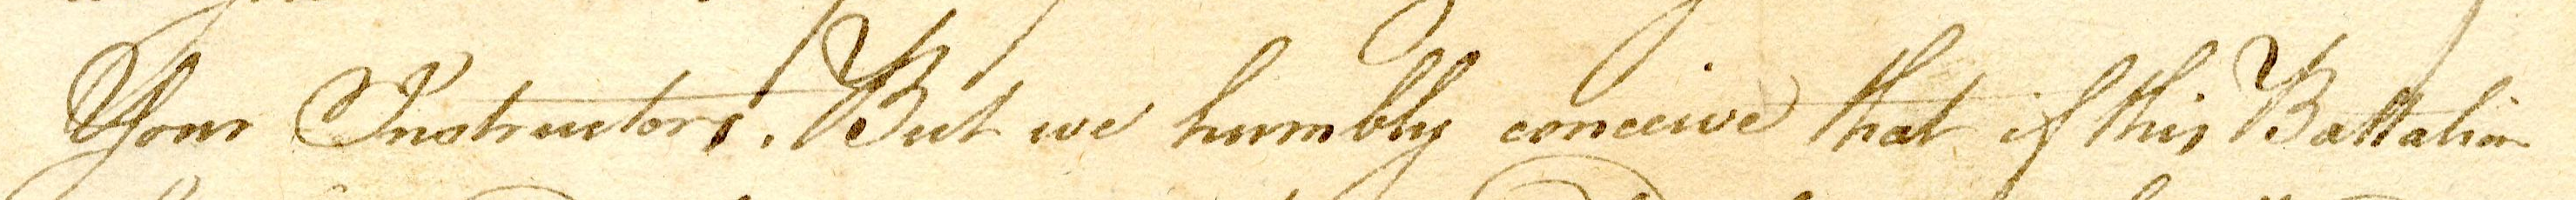Your Instructors. But we humbly conceive that if this Battalion
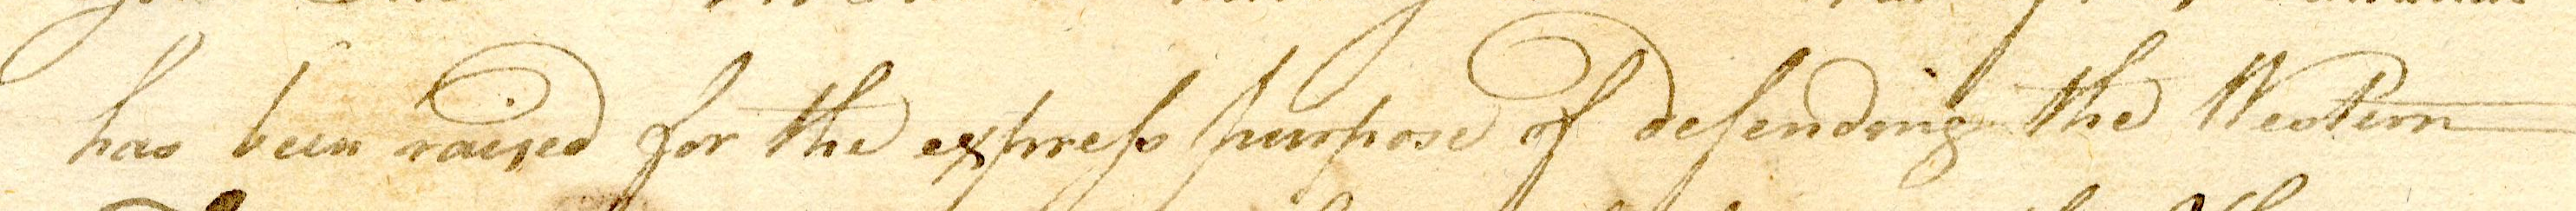has been raised for the express purpose of defending the Western
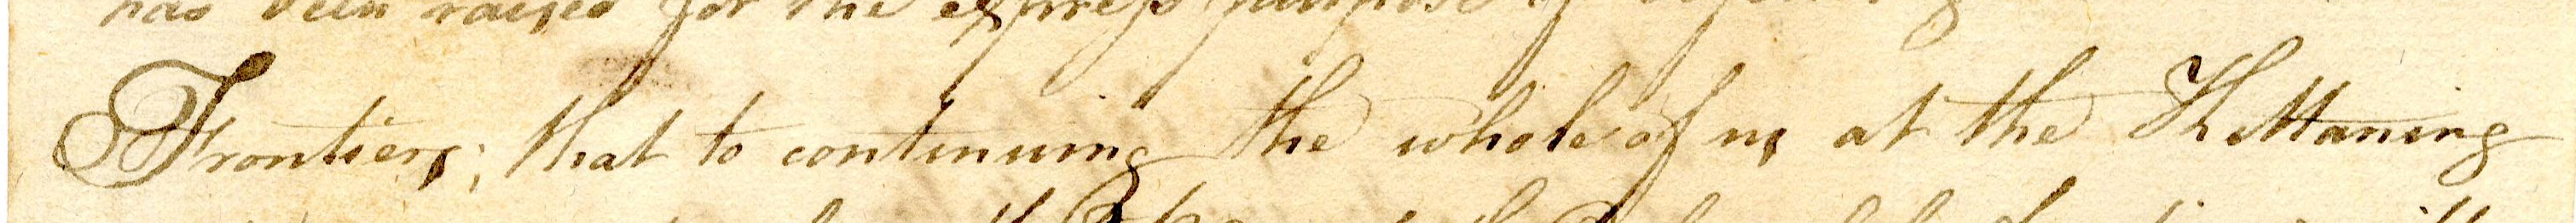Frontiers; that to continuing the whole of us at the Kittaning
